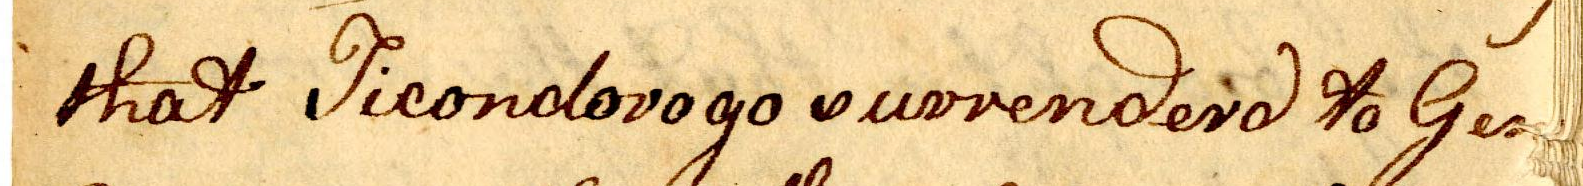that Ticondorogo surrenderd to Gen
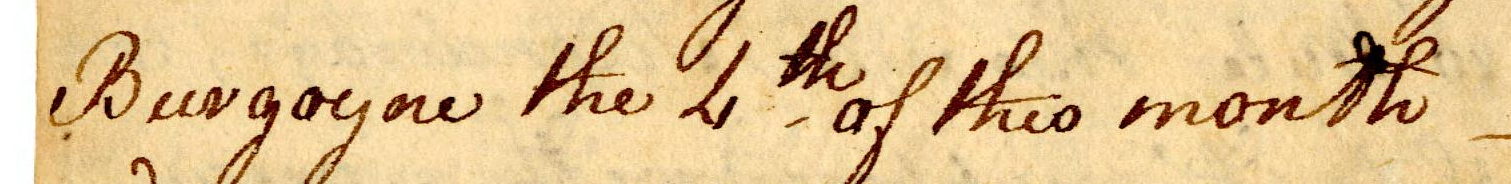Burgoyne the 4^th of this month-
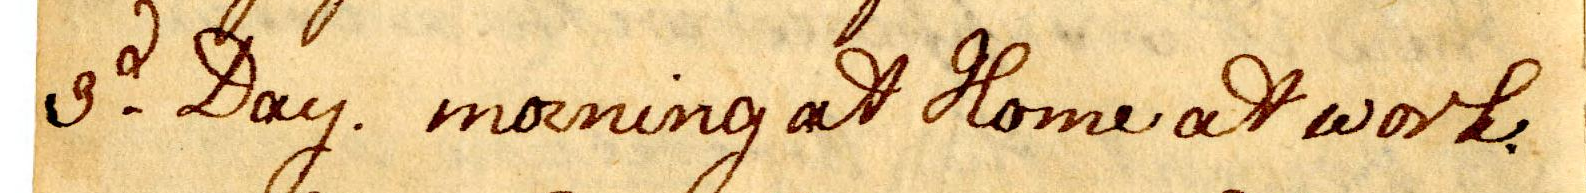3^d. Day. morning at Home at work.
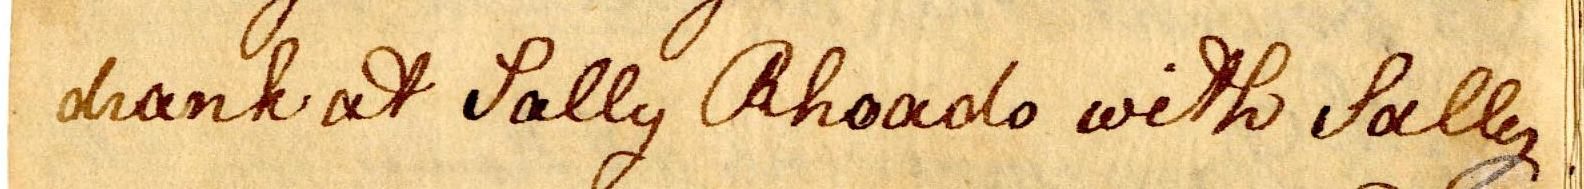drank at Sally Rhoads with Sally
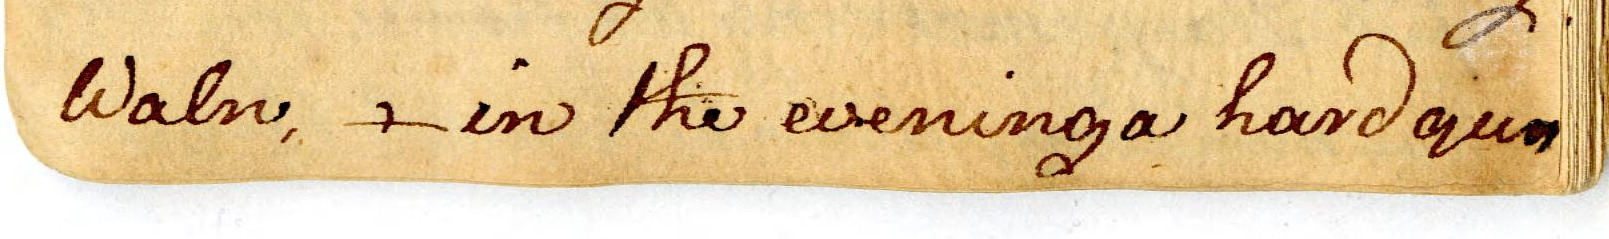Waln,- in the evening a hard qu[_]
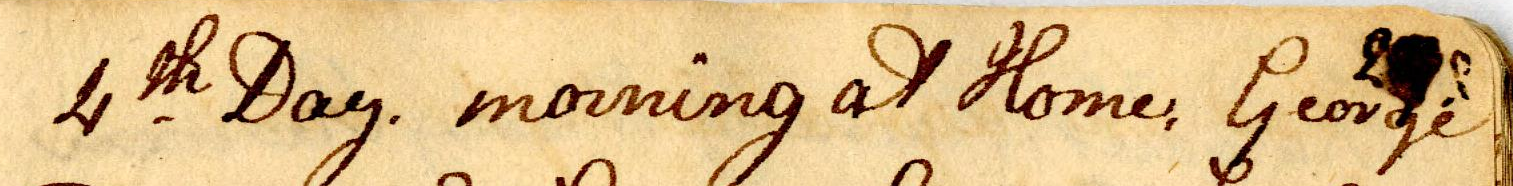4^th Day. morning at Home, George
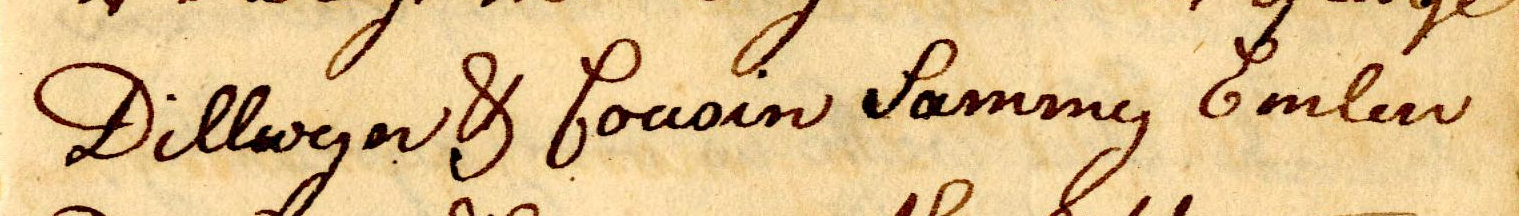Dillwyn & Cousin Sammy Emlen
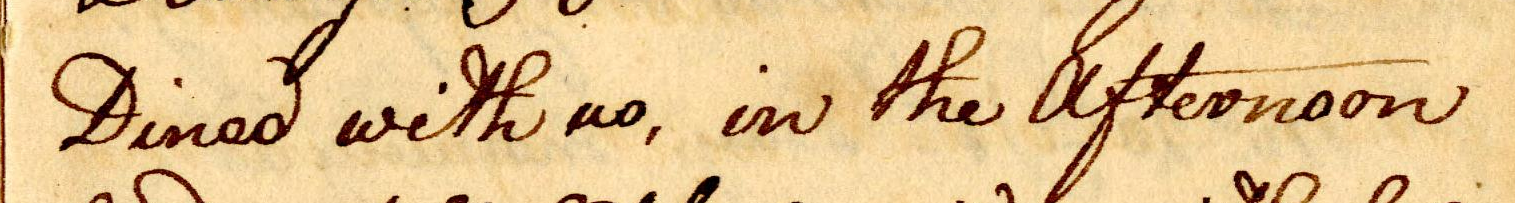Dined with us, in the Afternoon
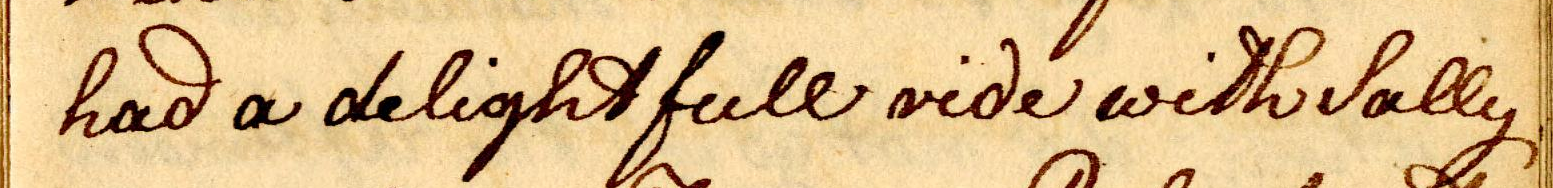had a delightfull ride with Sally
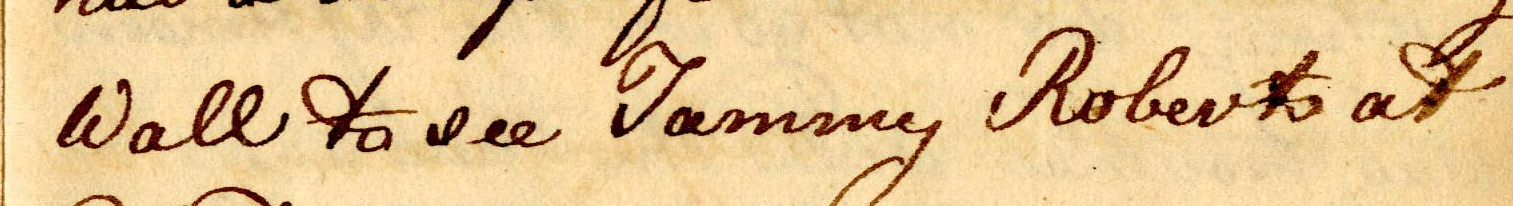Wall to see Tammy Roberts at
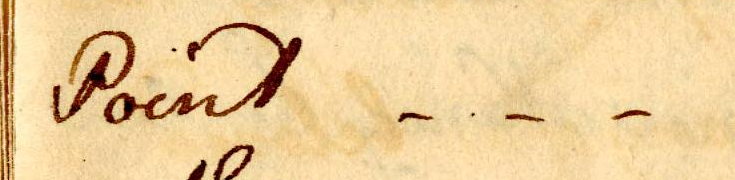Point---
